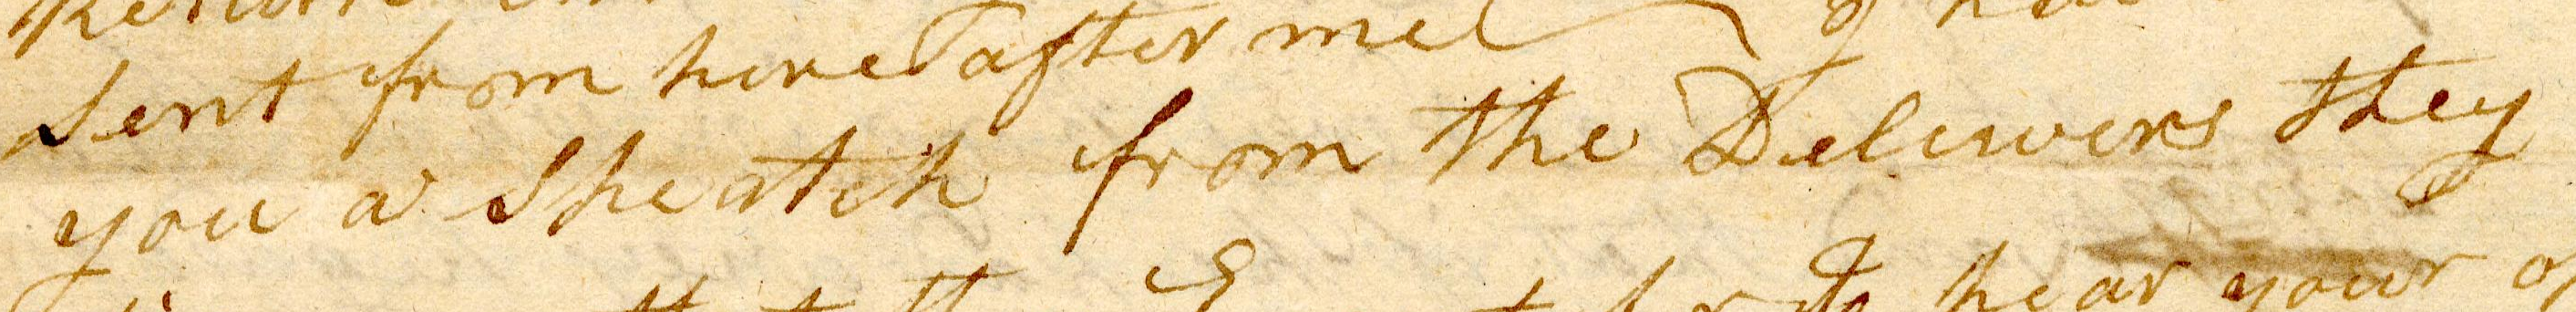you a speatch from the Delewers they
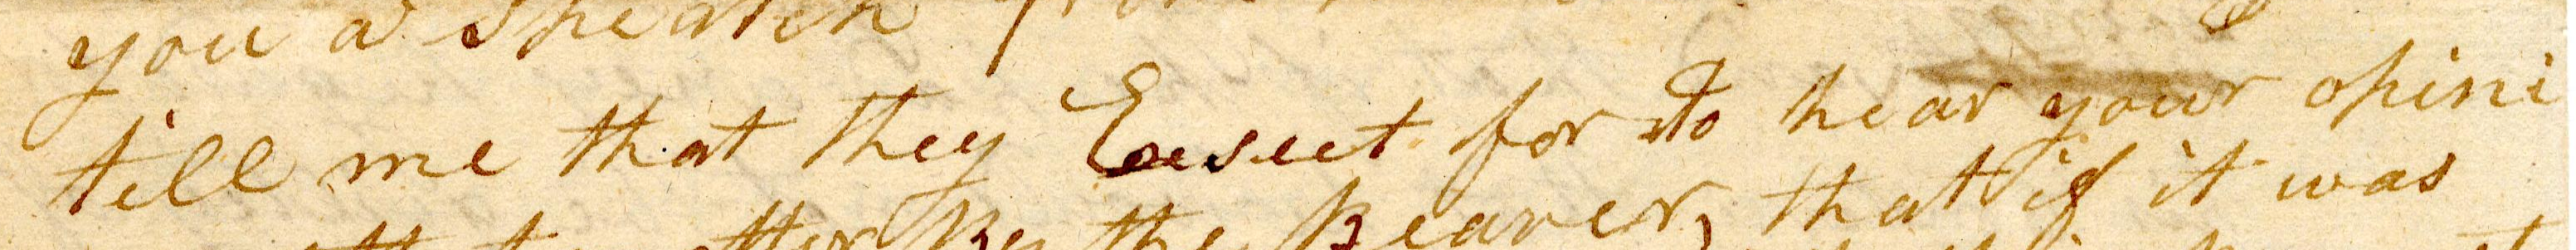till me that they Exsect for to hear your opini
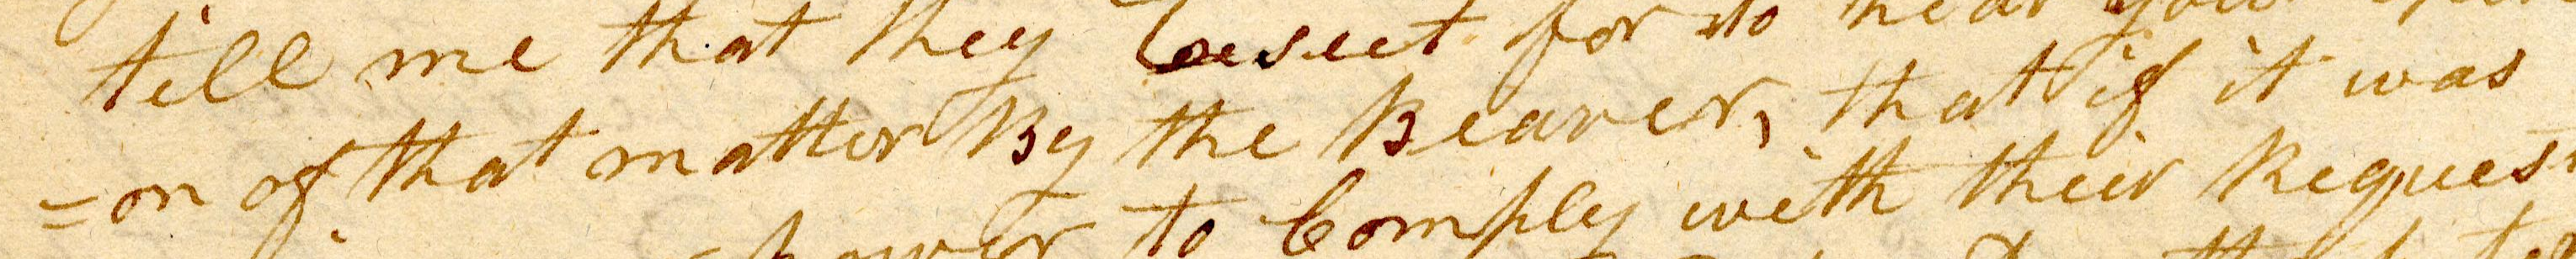-on of that matter By the Beaver, that if it was
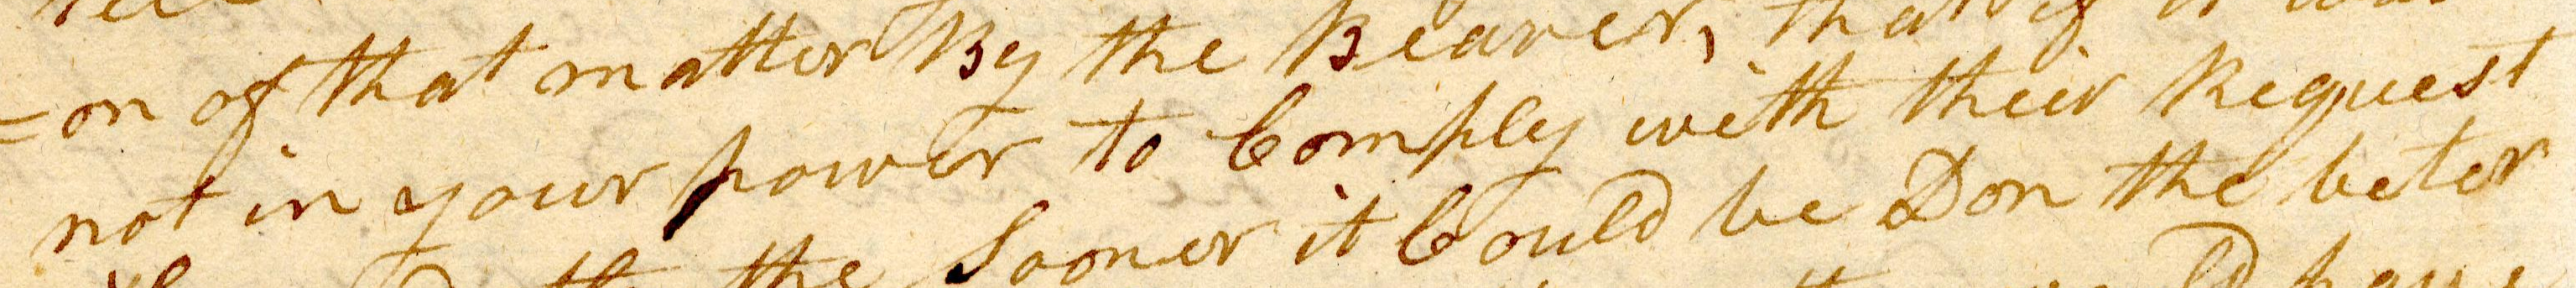not in your power to Comply with their Request
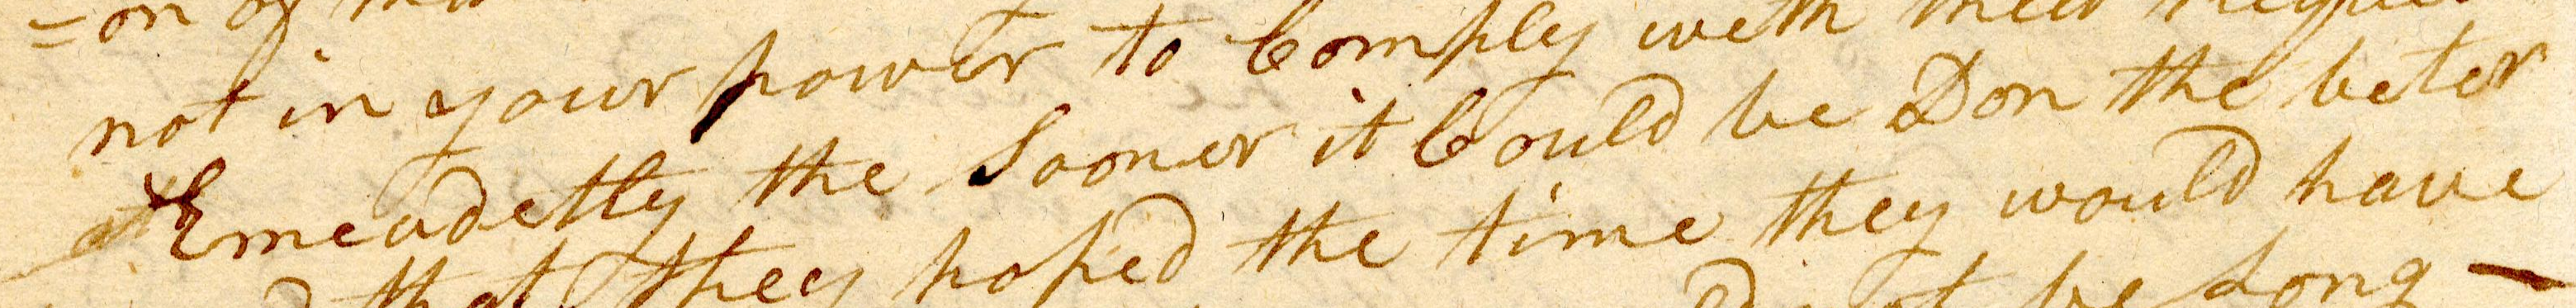Emeadetly, the Sooner it Could be Don the beter
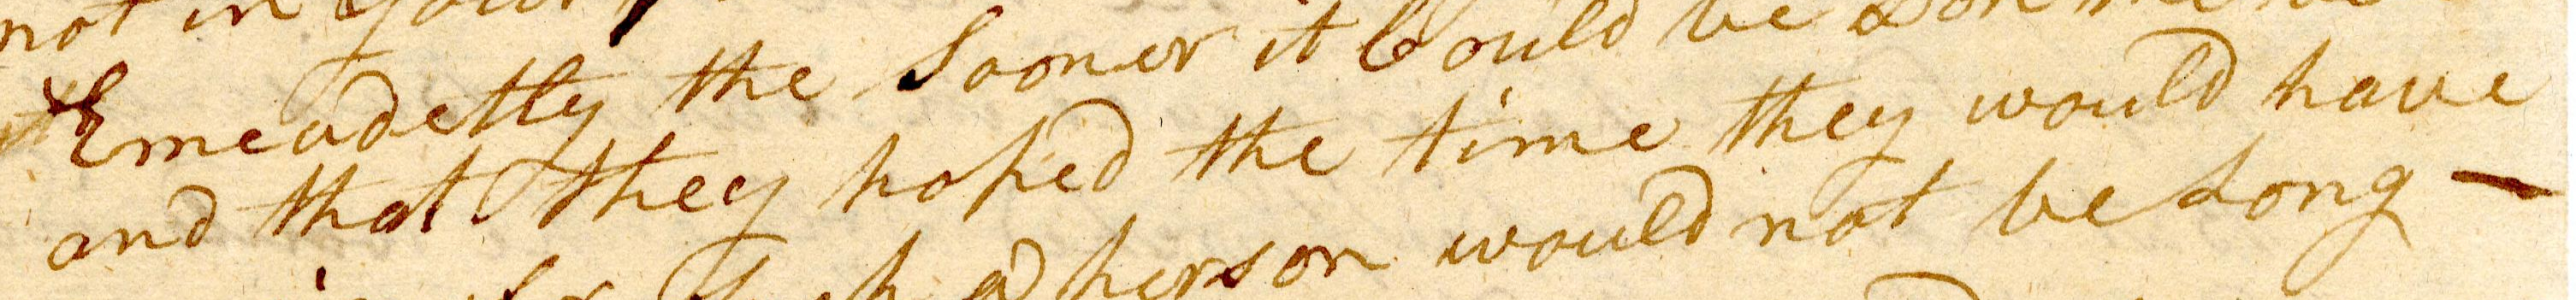and that they hoped the time they would have
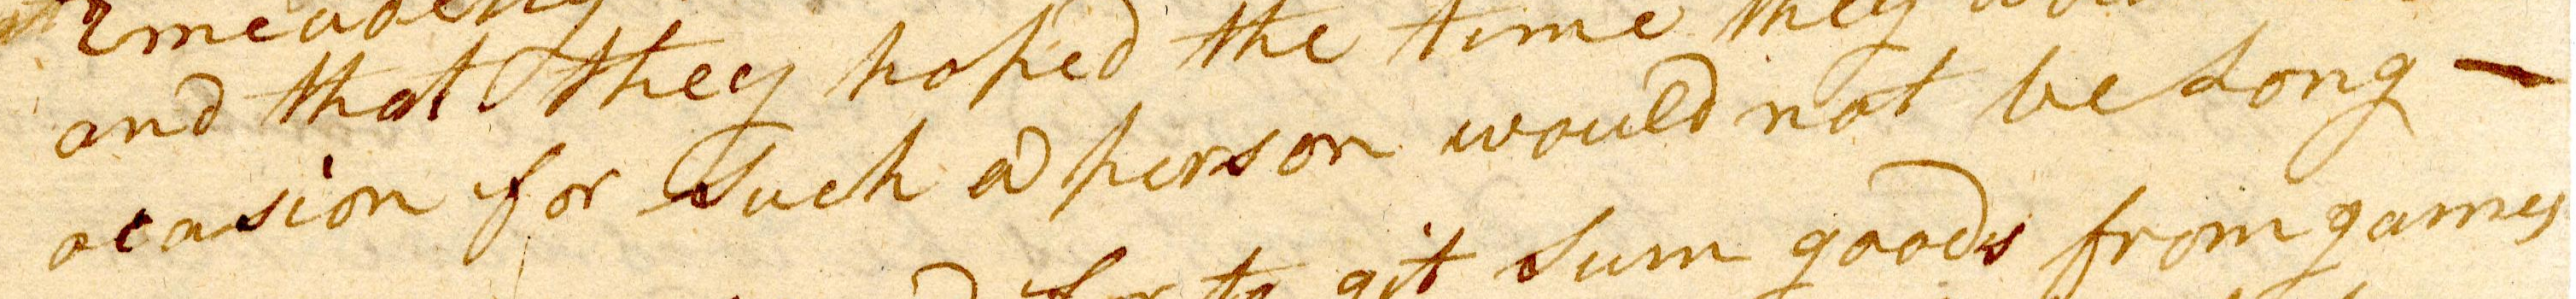ocasion for such a person would not be Long-
